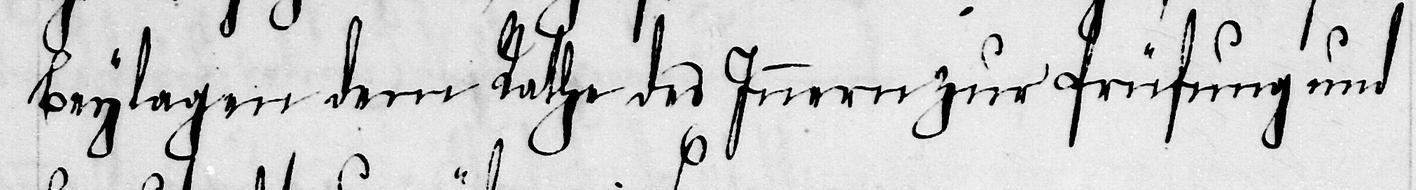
Beylagen dem Rathe des Innern zur Prüfung und
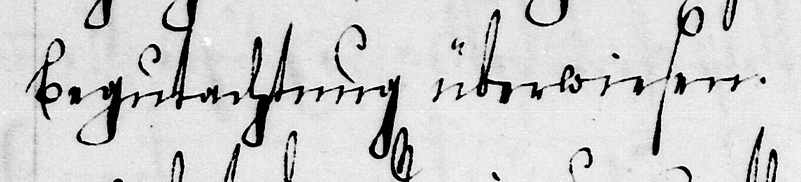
Begutachtung überwiesen.
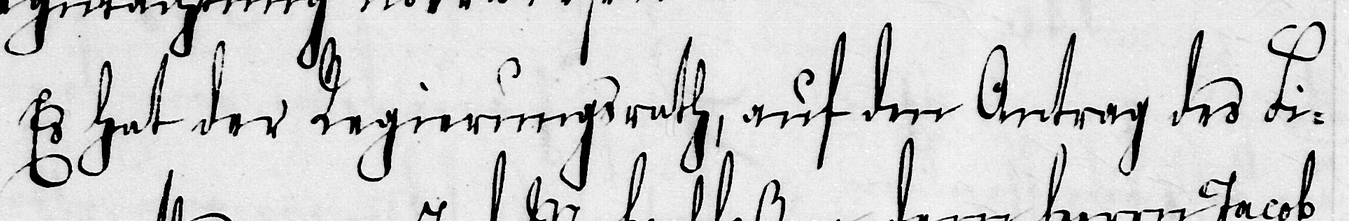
Es hat der Regierungsrath, auf den Antrag des Fi¬
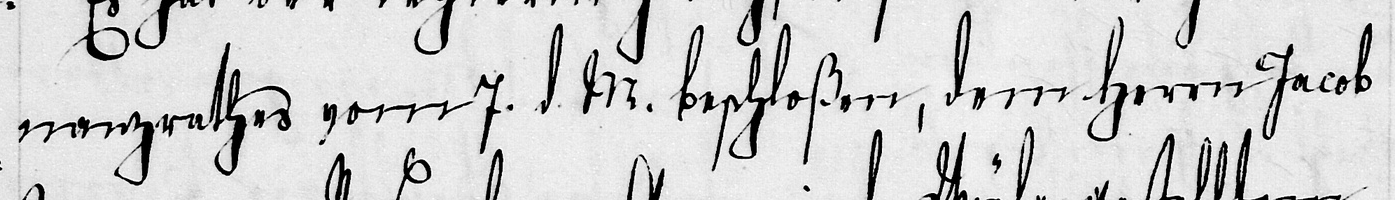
nanzrathes vom 7. d. M. beschloßen, dem Herrn Jacob
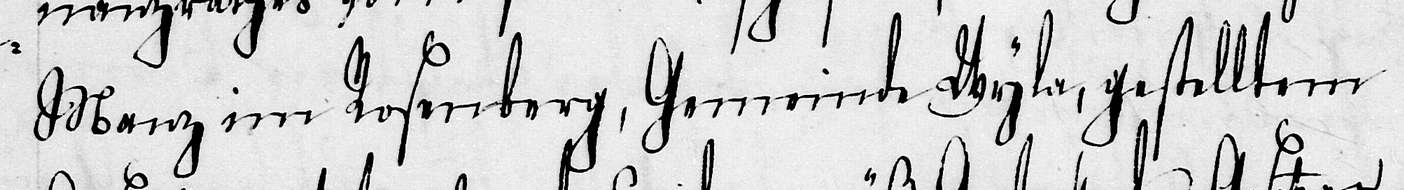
Manz im Rosenberg, Gemeinde Wyla, gestelltem
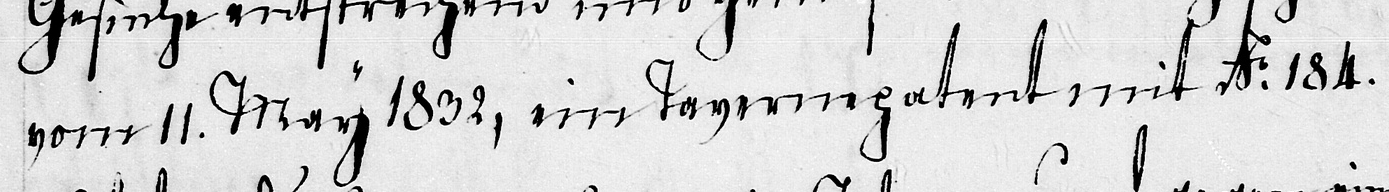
vom 11. May 1832., ein Tavernepatent mit No.184.
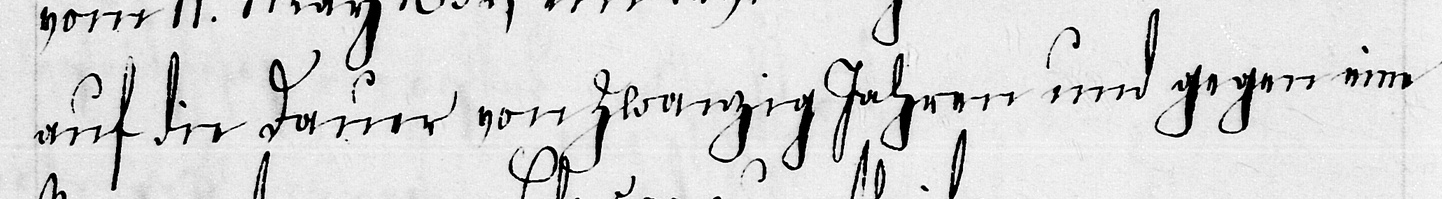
auf die Dauer von Zwanzig Jahren und gegen eine
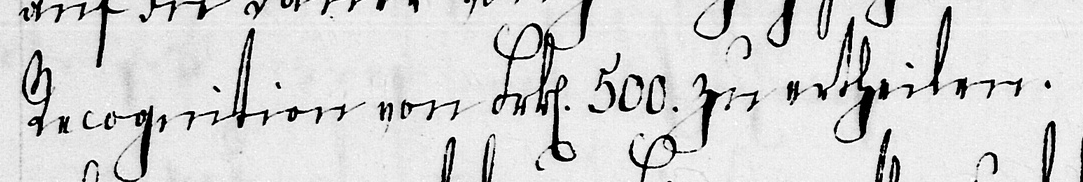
Recognition von Frk[en]. 500. zu ertheilen.
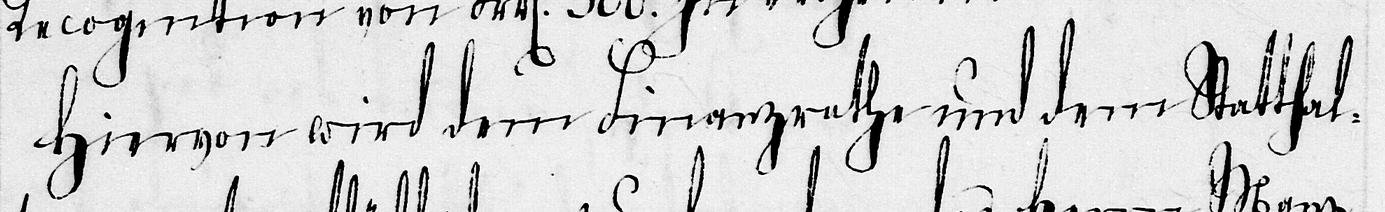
Hiervon wird dem Finanzrathe und dem Stattha¬
